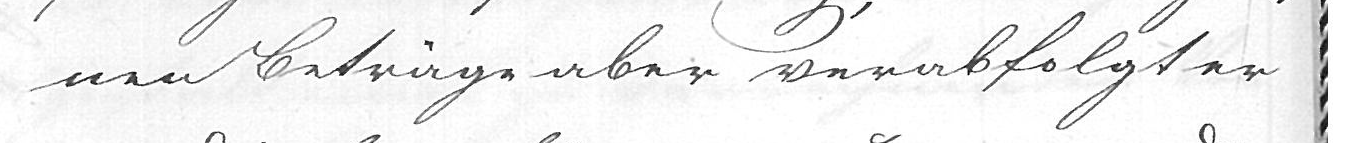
nen Beträge aber verabfolgt er
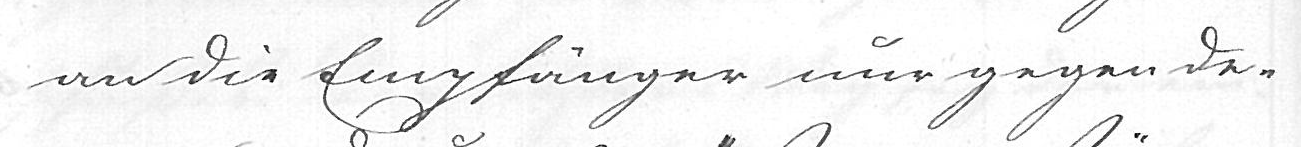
an die Empfänger nur gegen de-
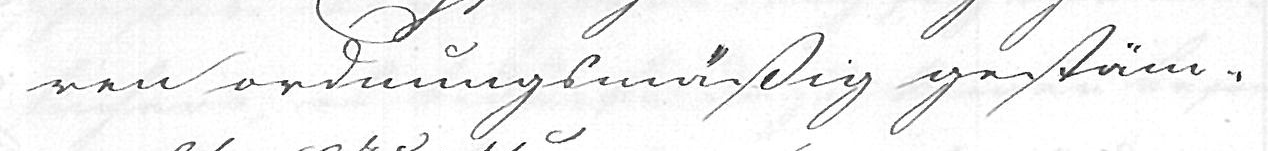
ren ordnungmäßig gestäm-
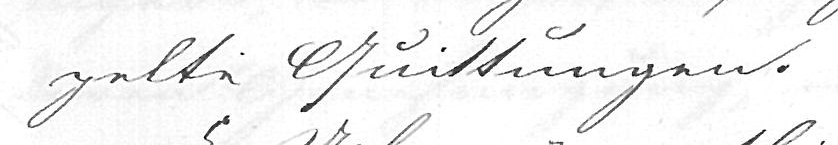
pelte Quittungen.
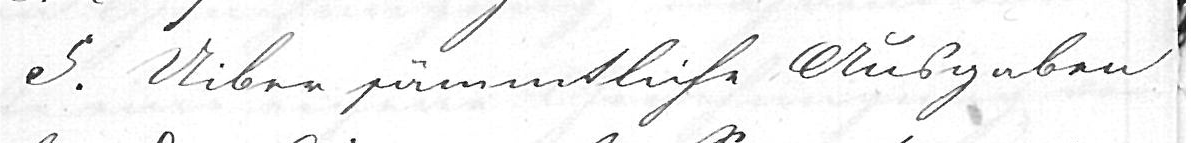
5. Uiber sämmtliche Ausgaben
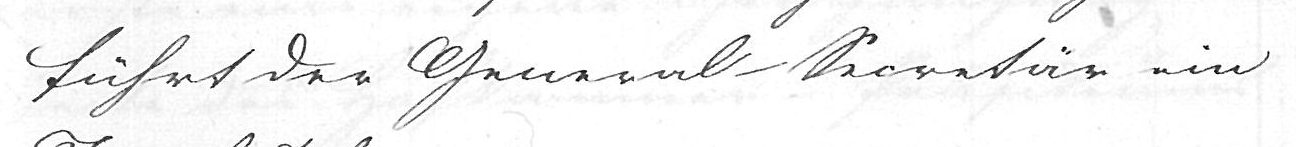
führt der General-Secretär ein
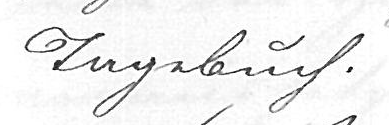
Tagebuch.
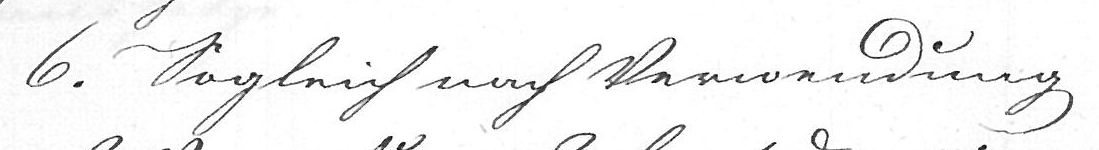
6. Sogleich nach Verwendung
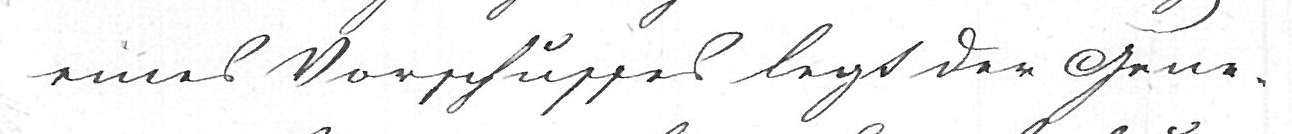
eines Vorschusses legt der Gene-
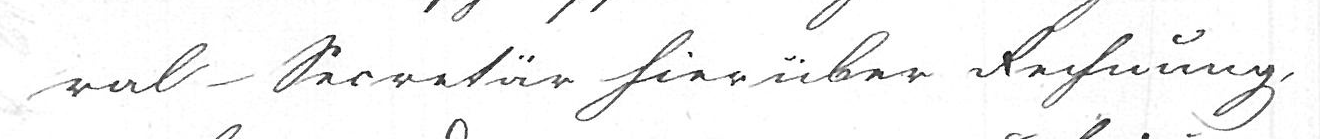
ral-Secretär hierüber Rechnung,
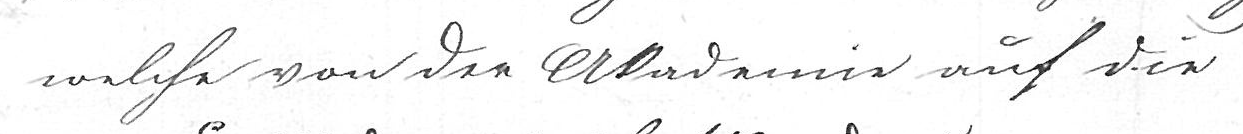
welche von der Akademie auf die
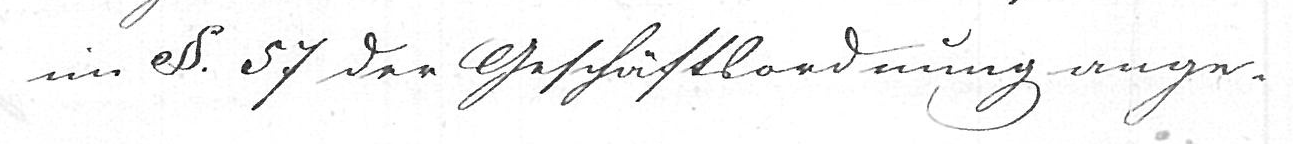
in § 57 der Geschäftsordnung ange-
